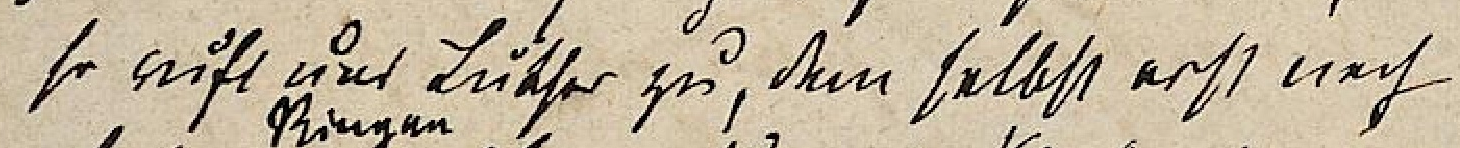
so ruft uns Luther zu, dem selbst erst nach
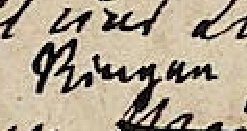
Ringen
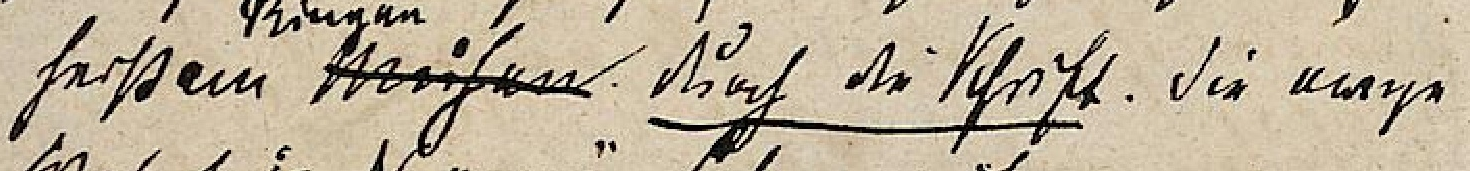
heißem Mühen durch die Schrift die ewge
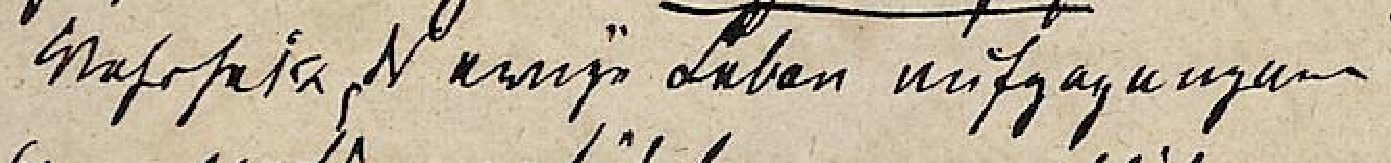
Wahrheit, ds ewige Leben aufgegangen
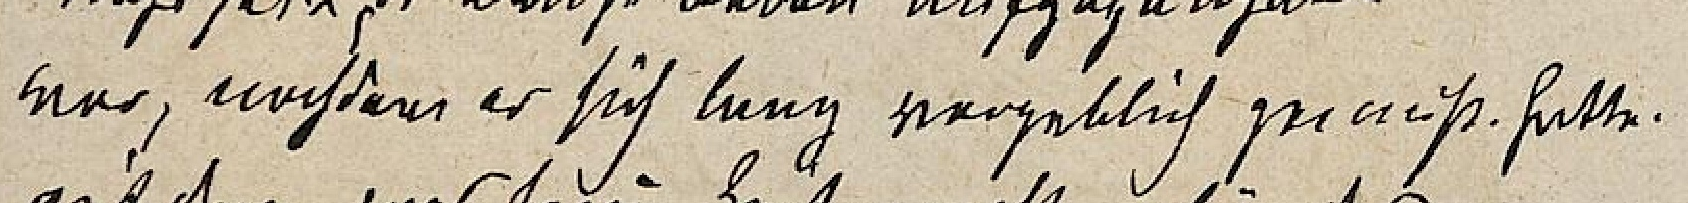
war, nachdem er sich lang vergeblich gemüht hatte.
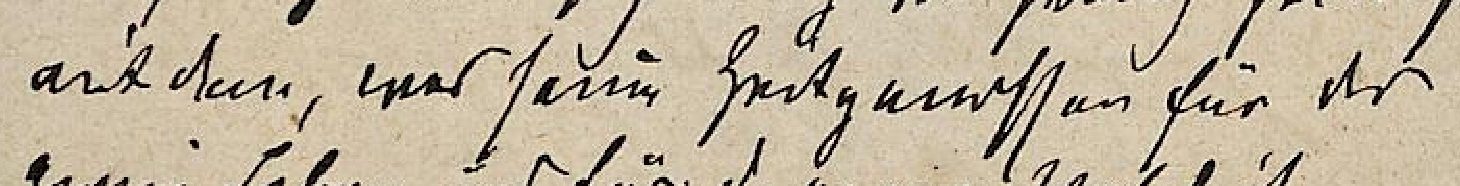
mit dem, was seine Zeitgenossen für ds
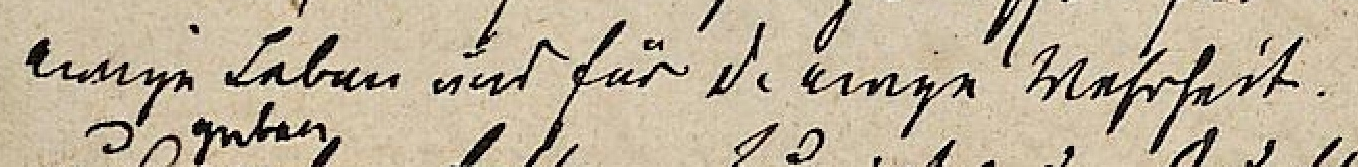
ewige Leben und für ewge Wahrheit
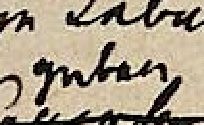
geben
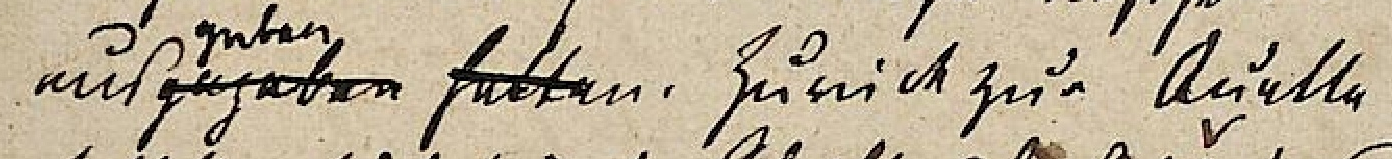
ausgegeben hatten. Zurück zur Quelle
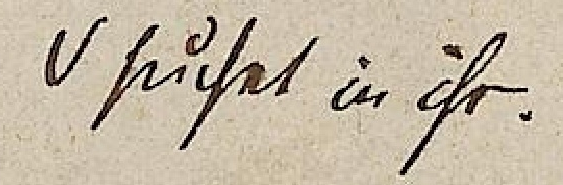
V suchet in ihr.
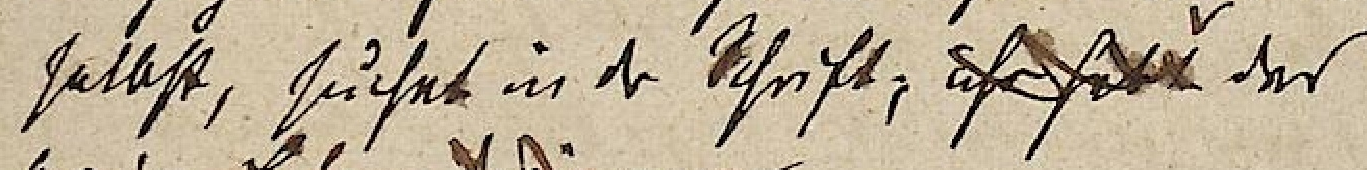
selbst, suchet in dr. Schrift, ihr hab das
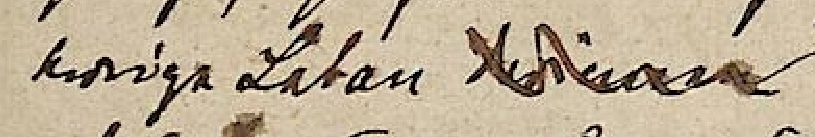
ewige Leben darinnen.
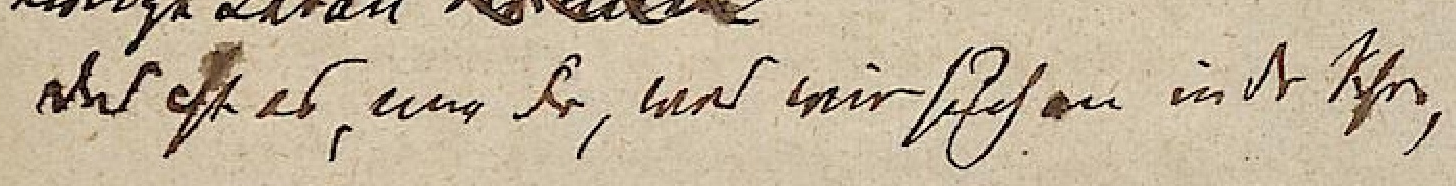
Das ist es, mn Fr, was wir suchen in dr Schr.,
